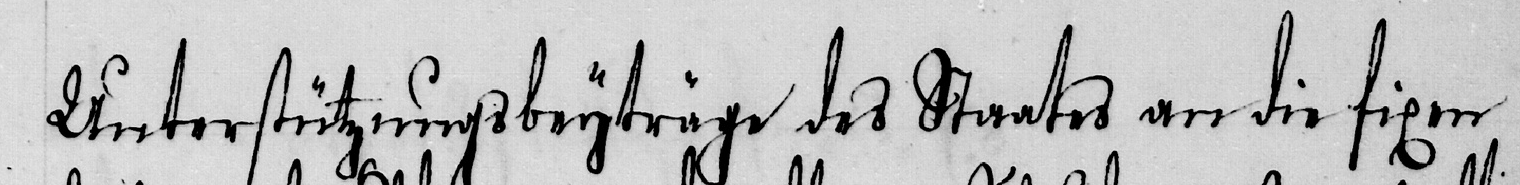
Unterstützungsbeyträge des Staates an die fixen
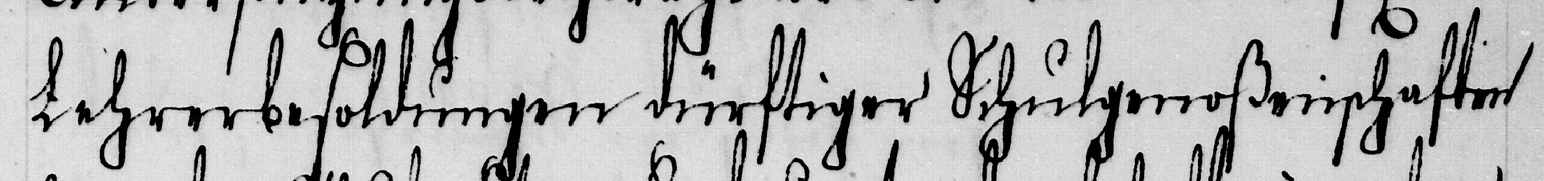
Lehrerbesoldungen dürftiger Schulgenoßenschaften
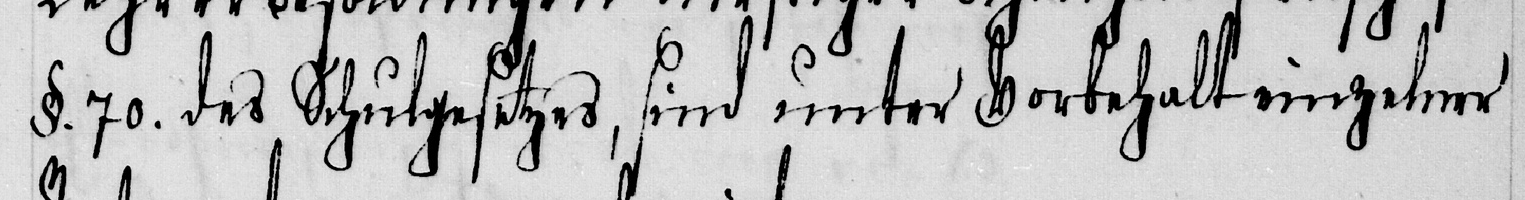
§. 70. des Schulgesetzes, sind unter Vorbehalt einzelner
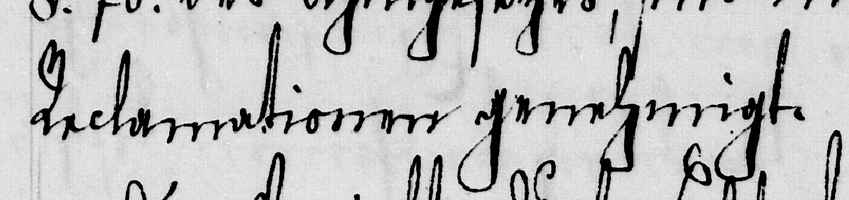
Reclamationen genehmigt.
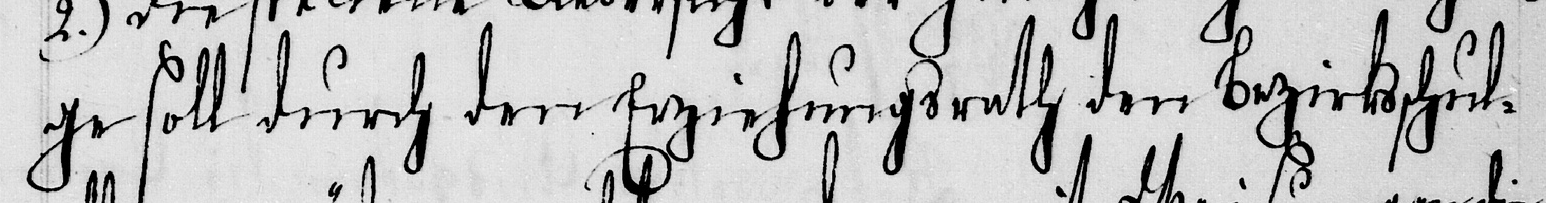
ge soll durch den Erziehungsrath den Bezirksschu¬
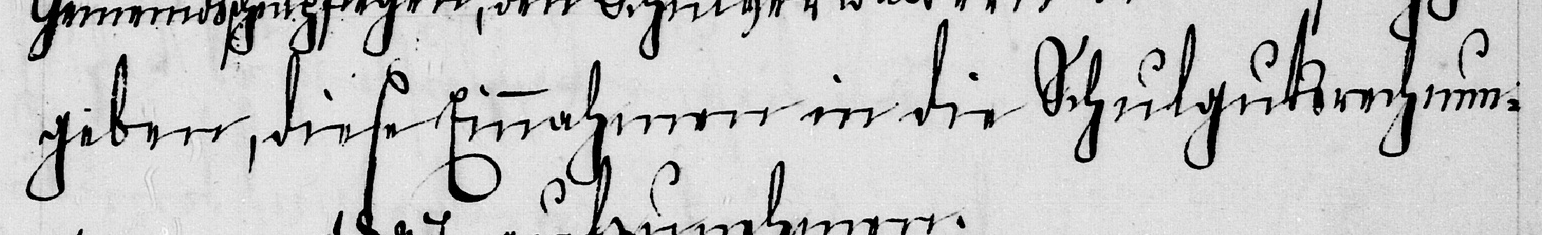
geben, diese Einnahmen in die Schulgutsrechnun¬
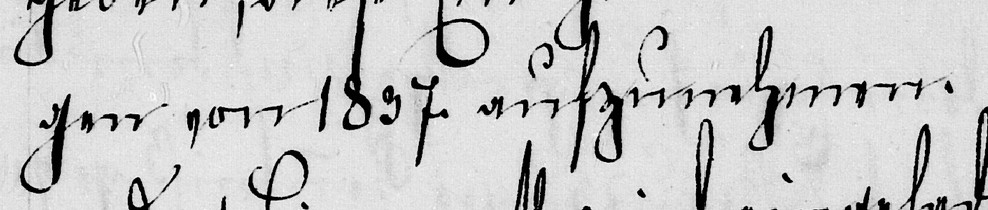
gen von 1837. aufzunehmen.
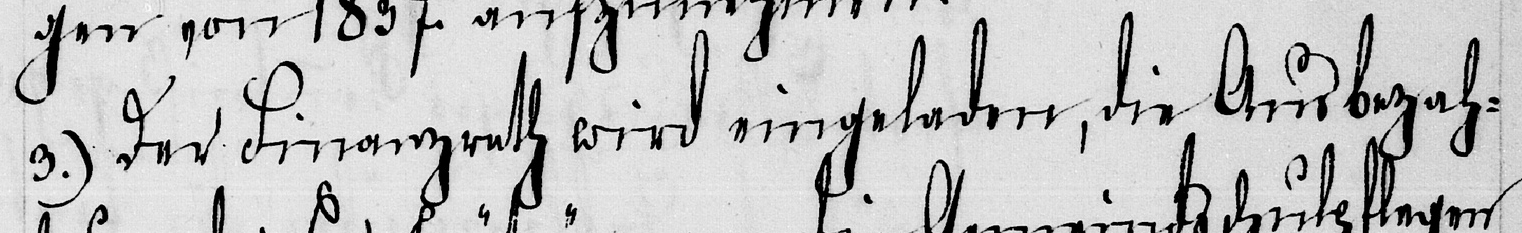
3.) Der Finanzrath wird eingeladen, die Ausbezah¬
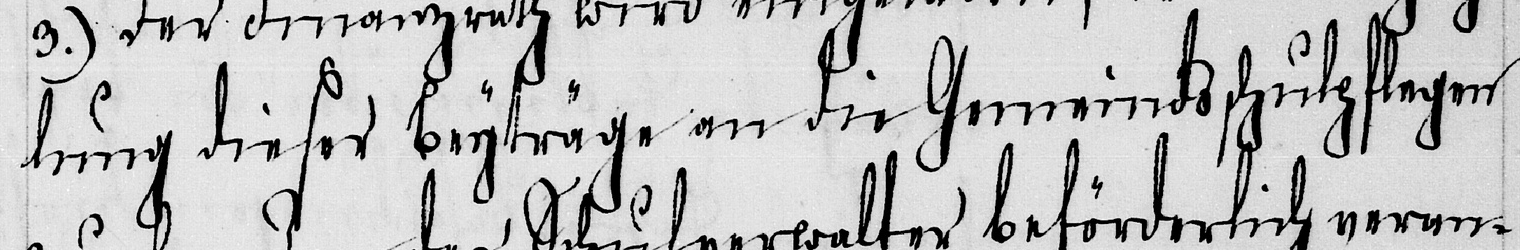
lung dieser Beyträge an die Gemeindsschulpflegen
